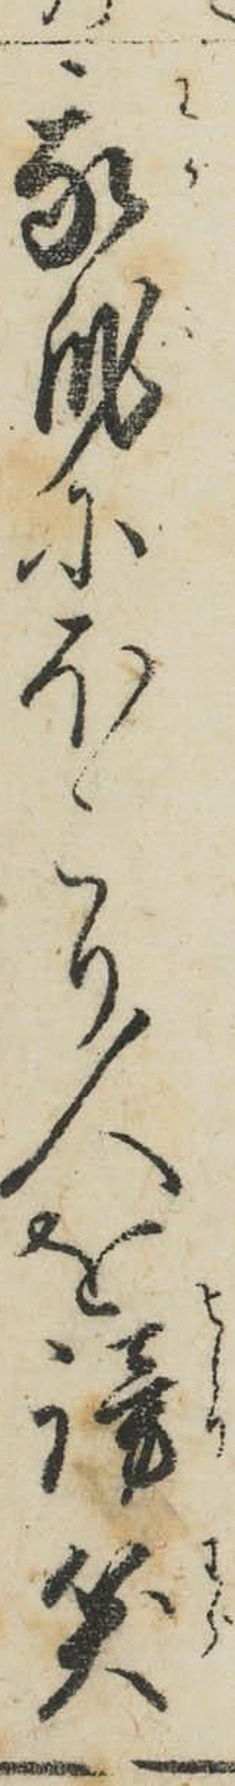我身にほこり人を謗笑

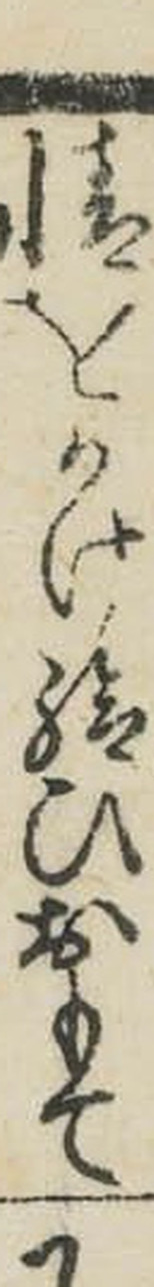情をかけ給ひおもて
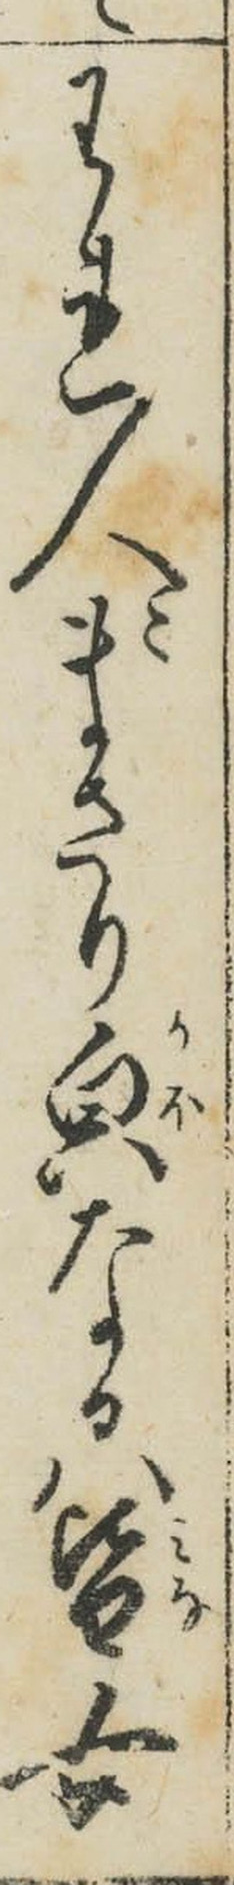われ人皃なるは皆女
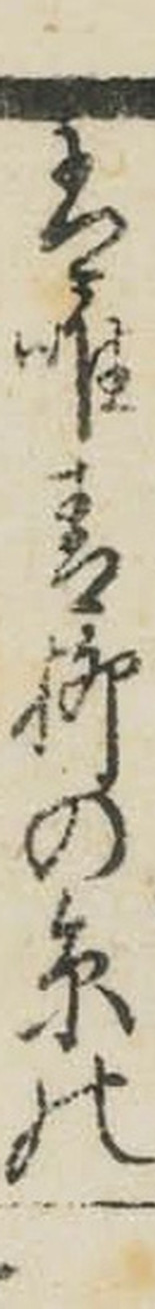は唯青柳の糸の
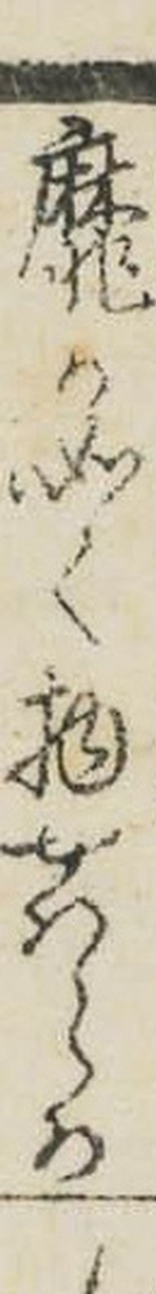靡か如く物やはらか
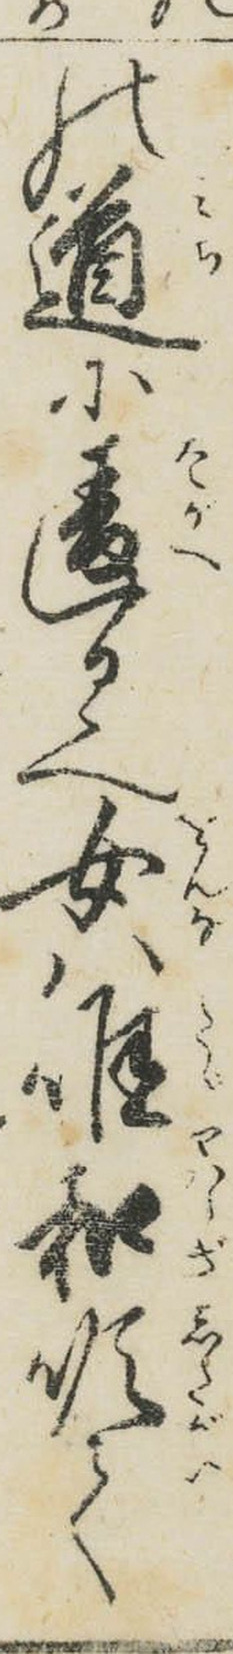の道に違る也女は唯和順て
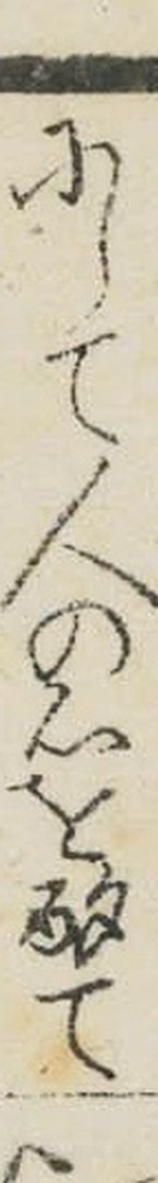にして人の心を酌て
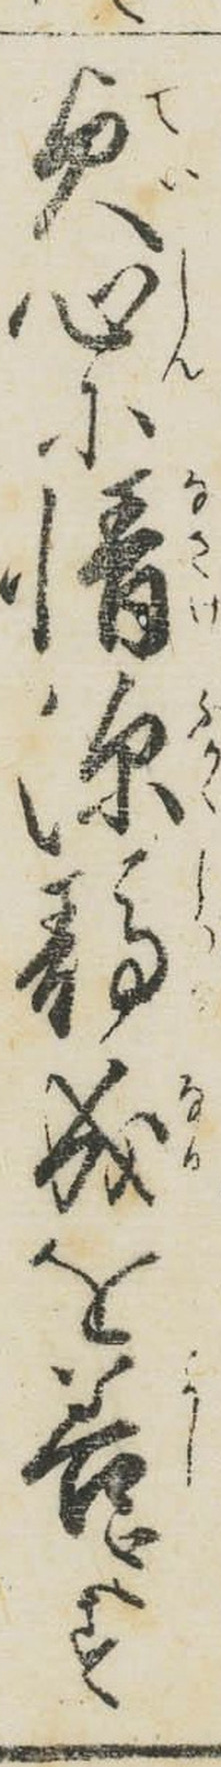貞心に情深静成を善とす
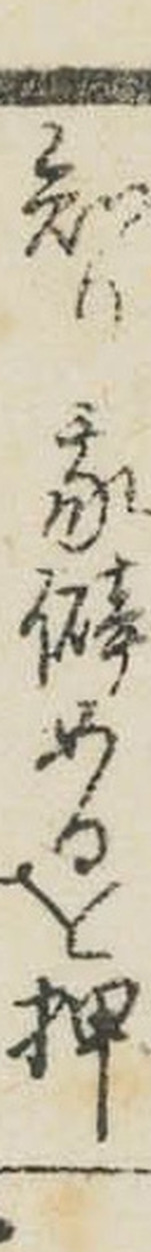知り我僻めるを押
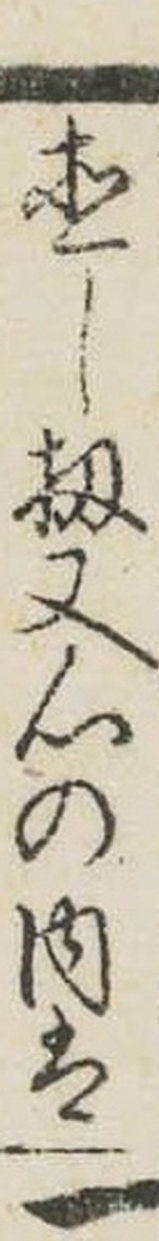直し扨又心の内は
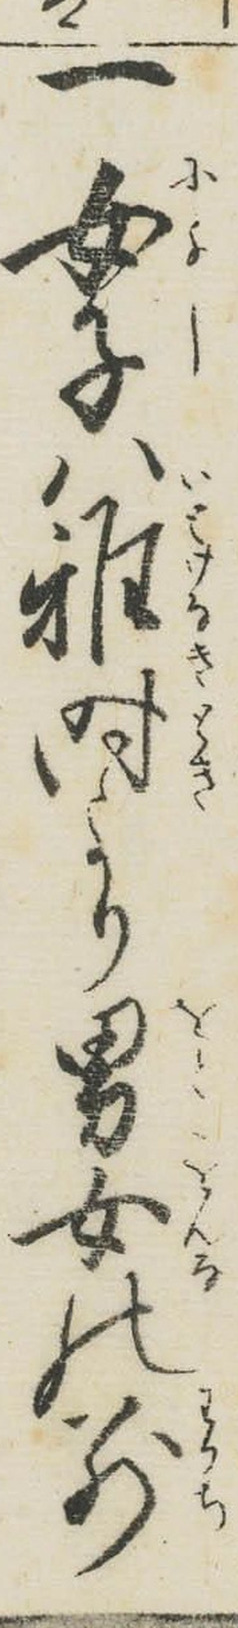一女子は稚時より男女の別
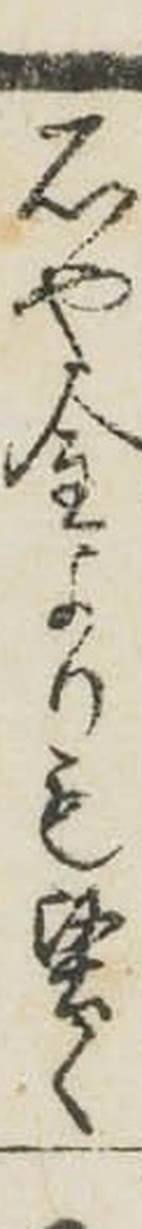石や金よりも堅く
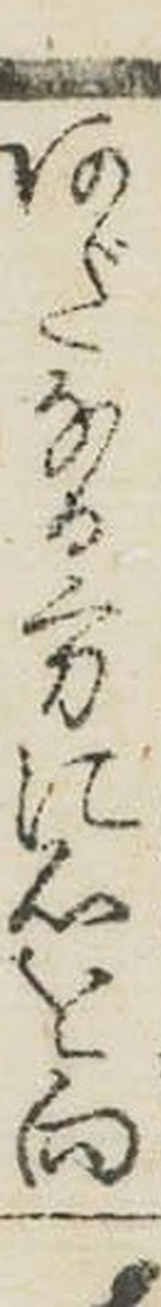あだなる方に心を向
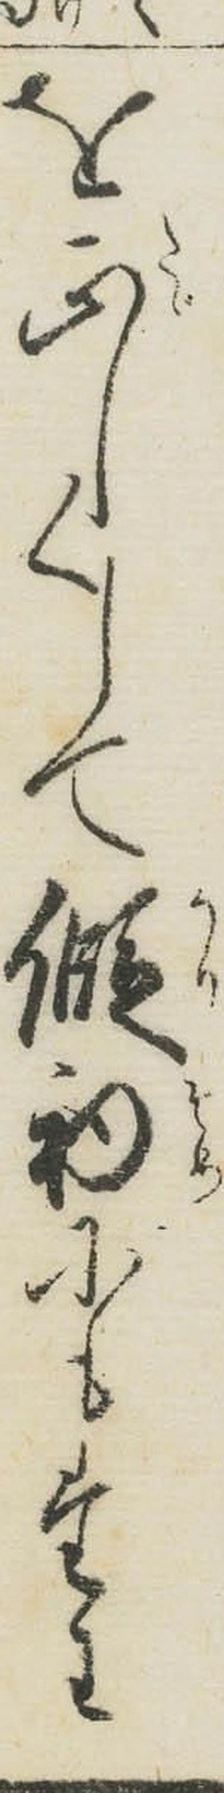を正しくして仮初にもたわ
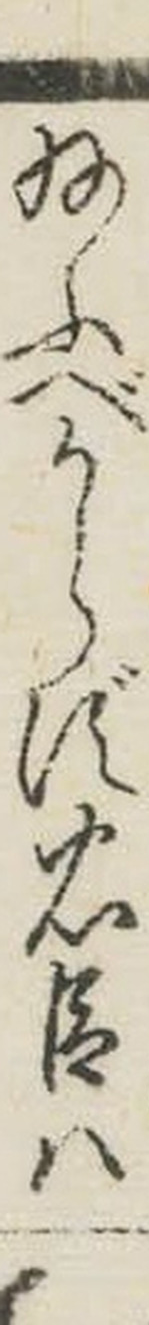給ふべからず忠臣は
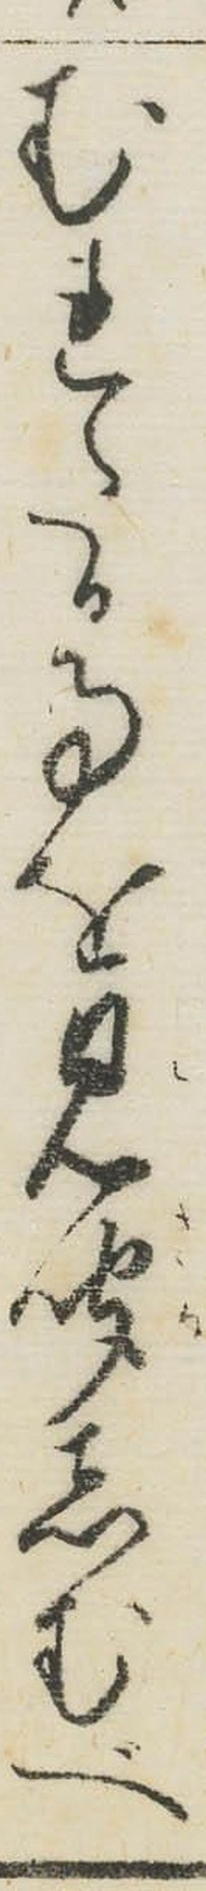むれたる事を見聞しむべ
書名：女大学
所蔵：東京学芸大学教育コンテンツアーカイブ
